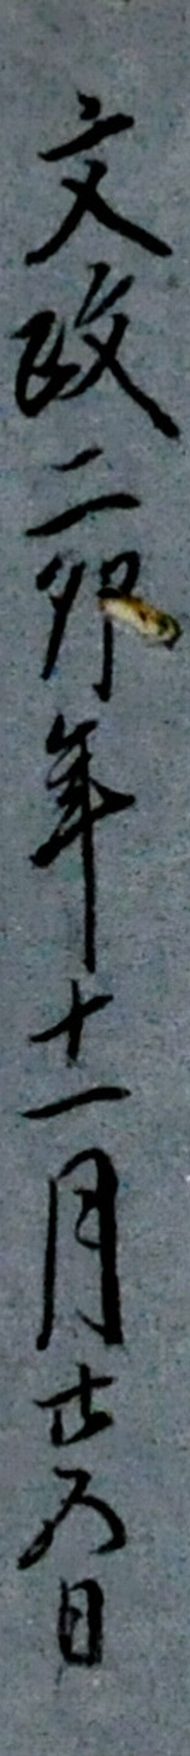文政二卯年十一月廿五日
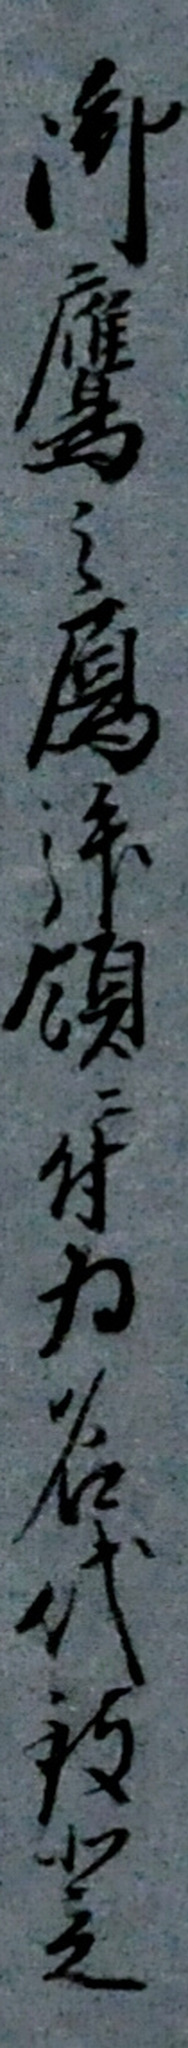御鷹之鳫拝領ニ付為名代致登
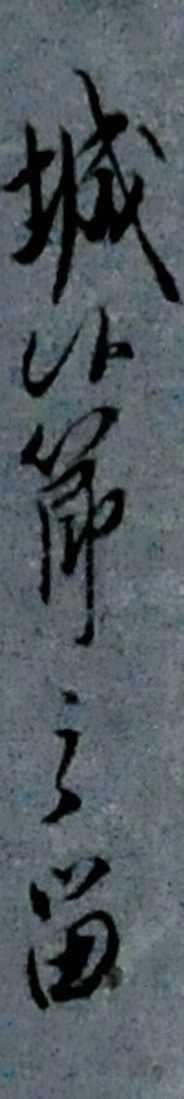城候節之留
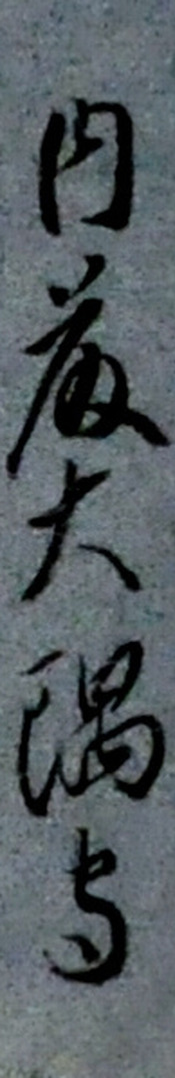内藤大隈守

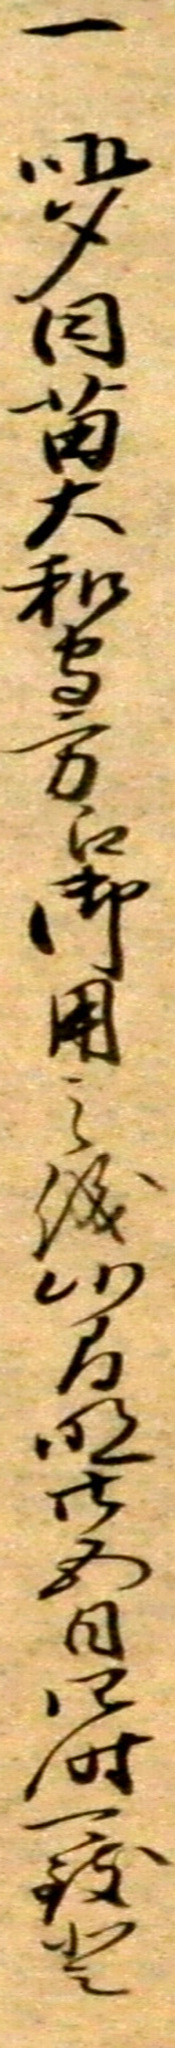一昨夕同苗大和守方え御用之儀候間明廿五日四時可致登
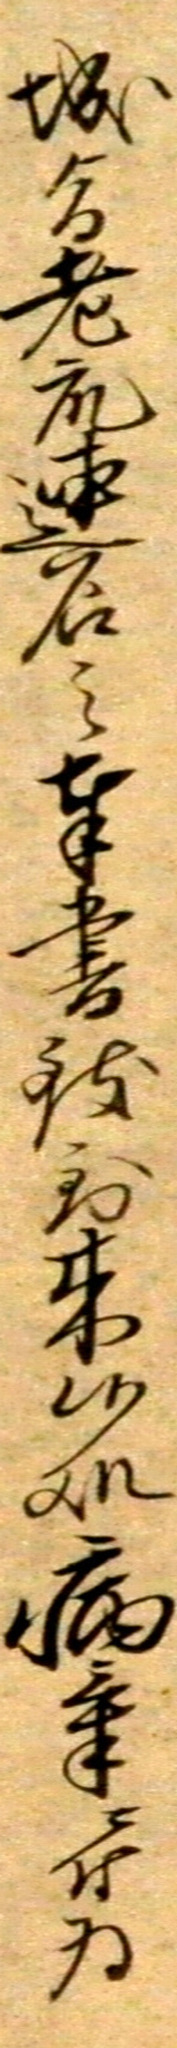城旨老衆連名之奉書致到来候処病気ニ付為
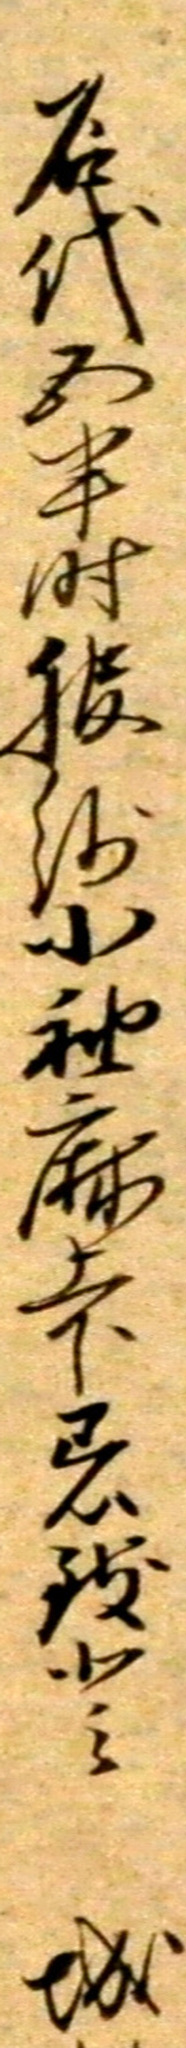名代五半時服紗小袖麻上下着致登城候
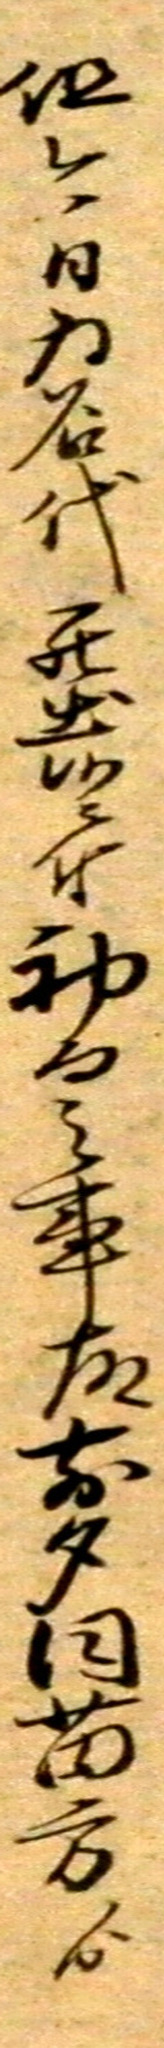但今日為名代罷出候ニ付初而之事故前夕同苗方ゟ
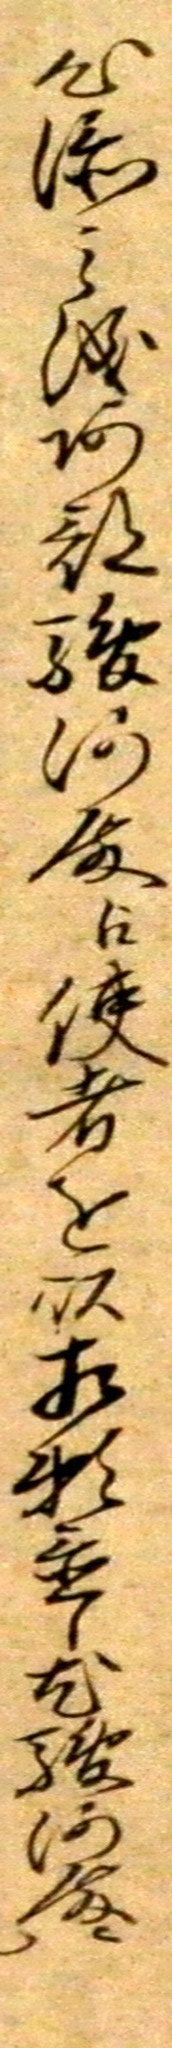心添之儀阿部駿河殿え使者を以相頼置候尤駿河殿ニも
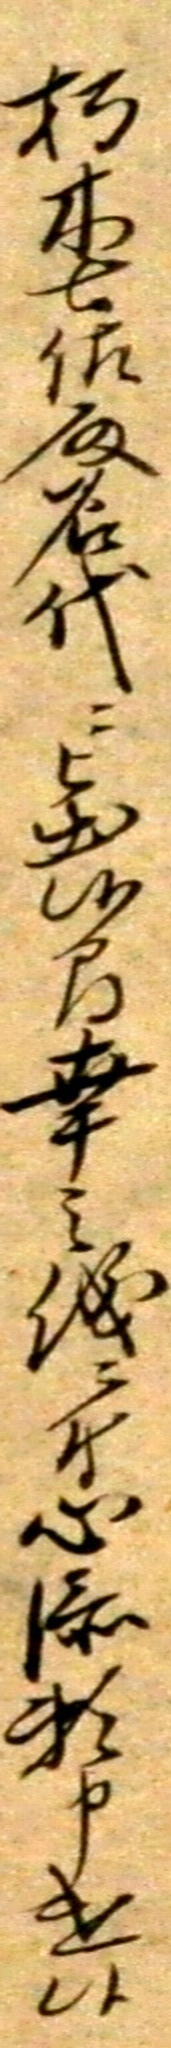朽木七佐殿名代ニ被出候間幸之儀ニ付心添頼申遣候
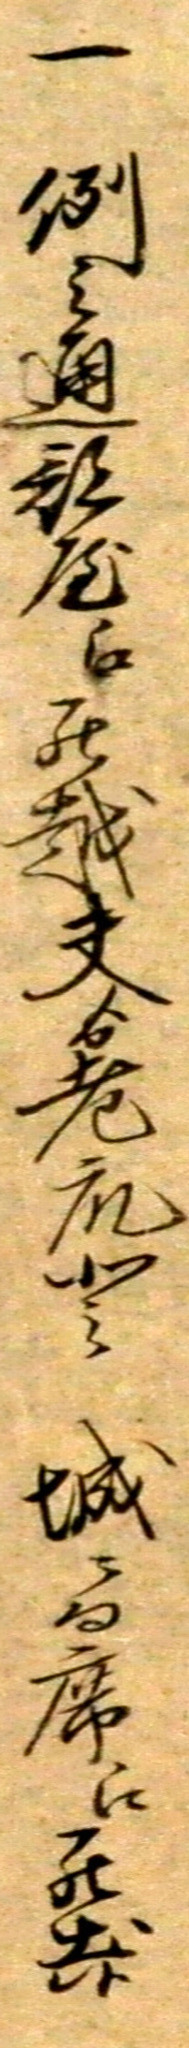一例之通部屋え罷越夫ゟ老衆登城ニ而席え罷出候
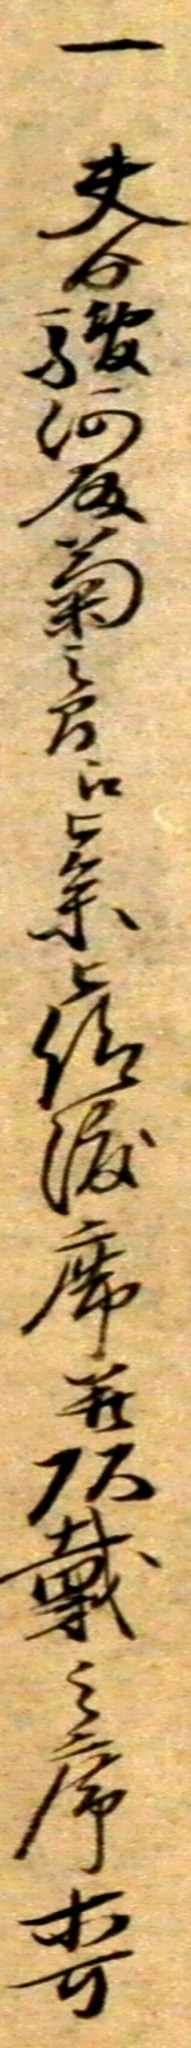一夫ゟ駿河殿菊之間え被参被仰渡席并頂戴之席等可
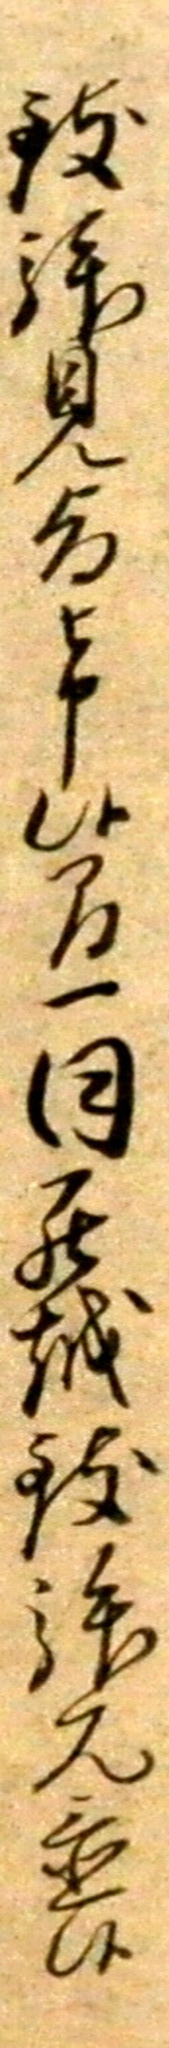致拝見旨被申候間一同罷越致拝見置候
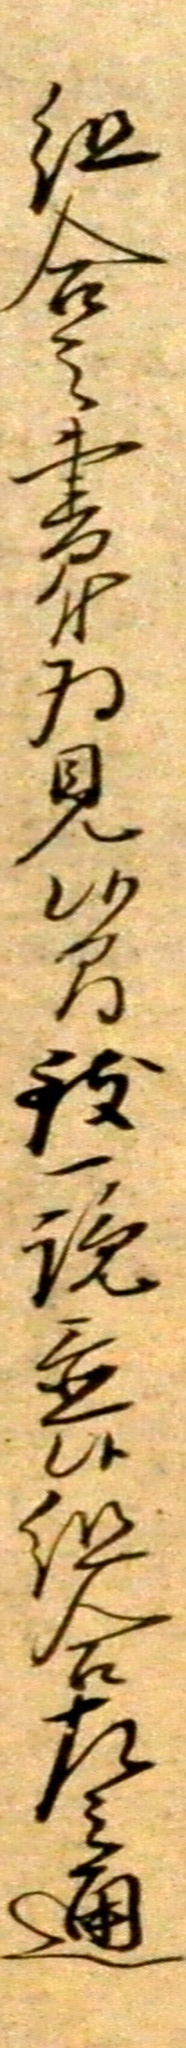組合之書付為見候間致一覧置候組合左之通
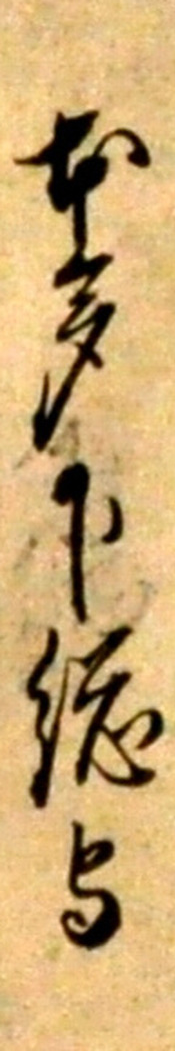本多下総守
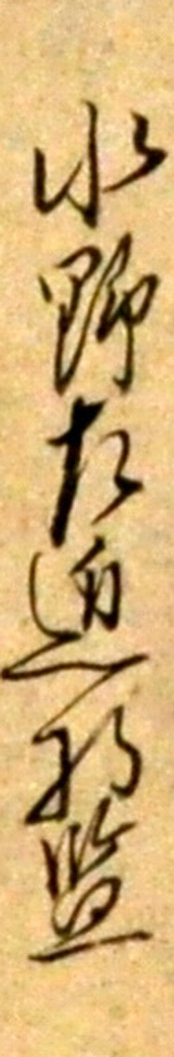水野左近将監
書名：御鷹ノ雁拝領ニ付名代トシテ登城ノ節ノ留
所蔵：伊那市立高遠町図書館・合同会社AMANE
